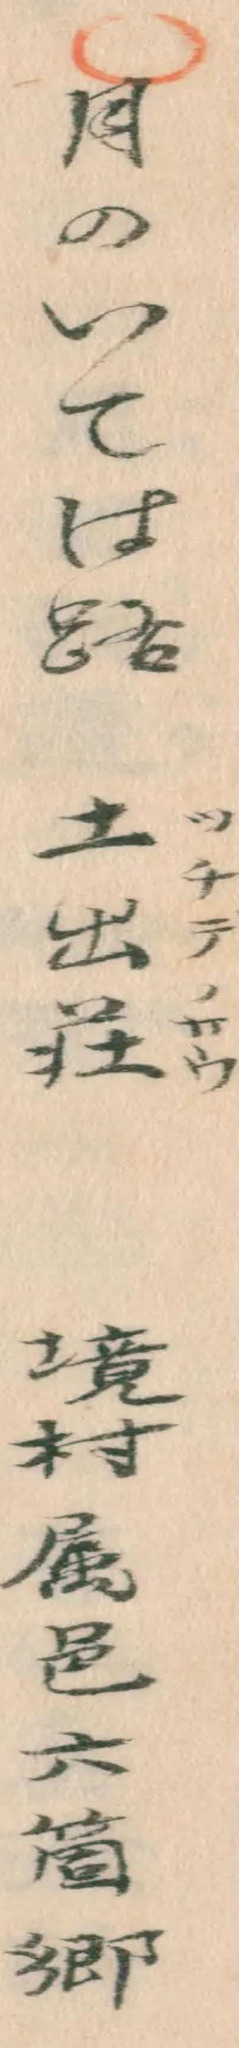○月のいては路土出荘境村属邑六箇郷

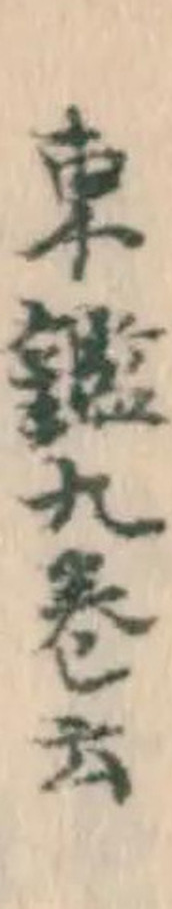東鑑九巻六
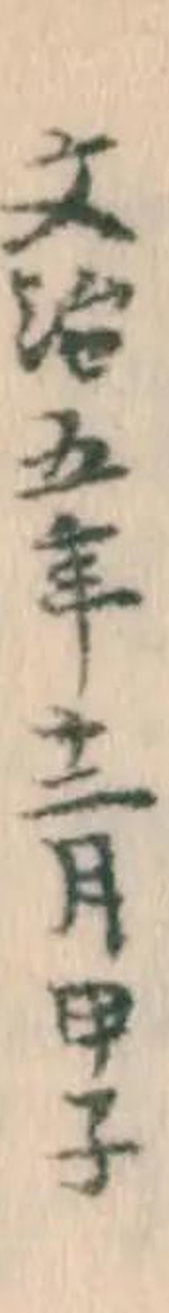文治五年十二月甲子
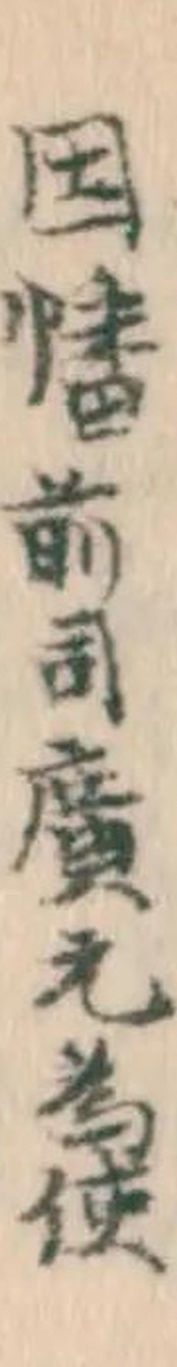因幡前司廣光為使
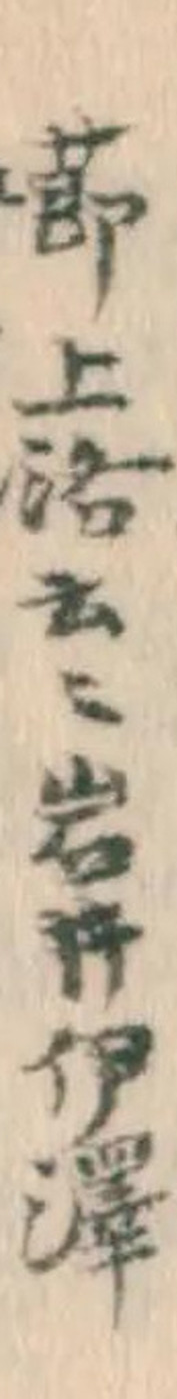莭上洛云々岩井伊澤
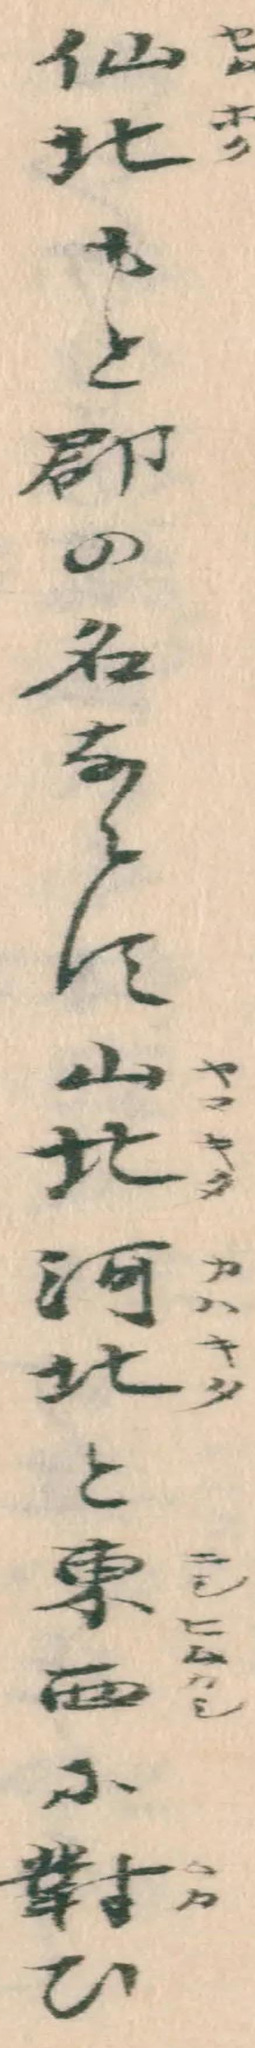仙北もと郡の名ならす山北河北と東西に對ひ
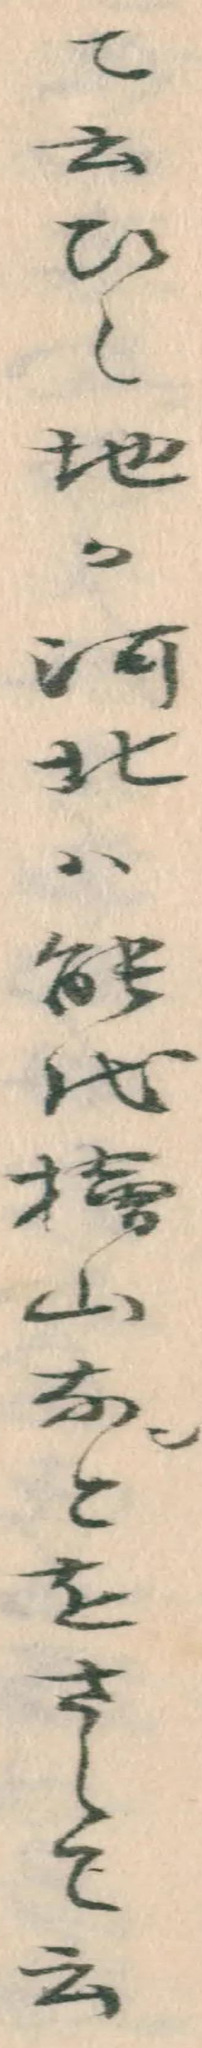て云ひし地か河北は能代檜山なンとをさして云
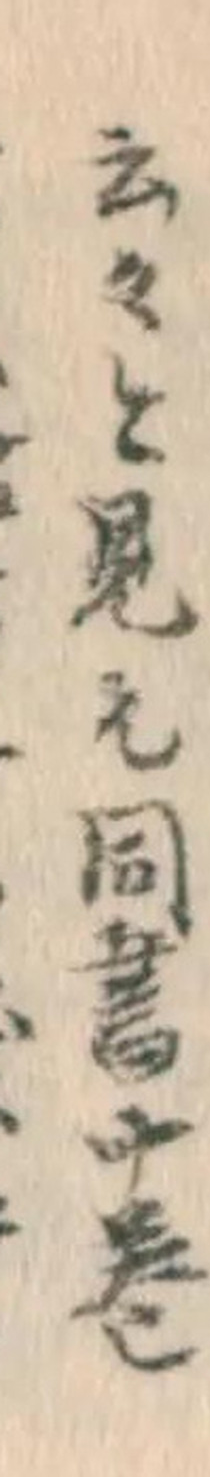云々と見え同書十巻
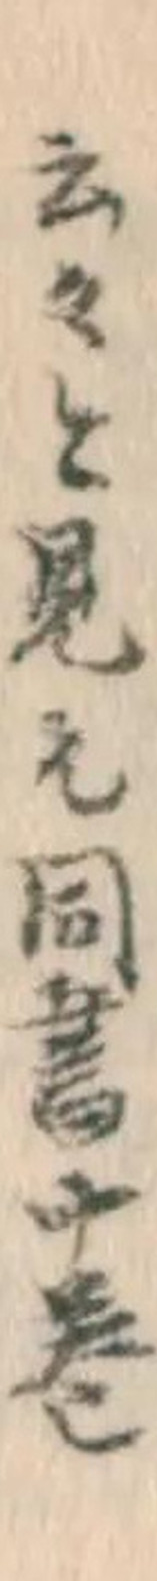云々と見え同書十巻
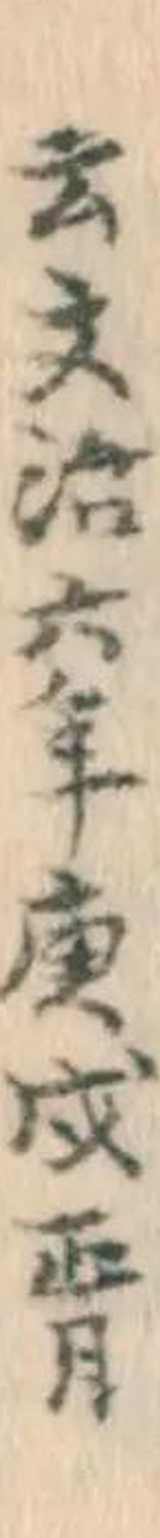云文治六年庚戌正月
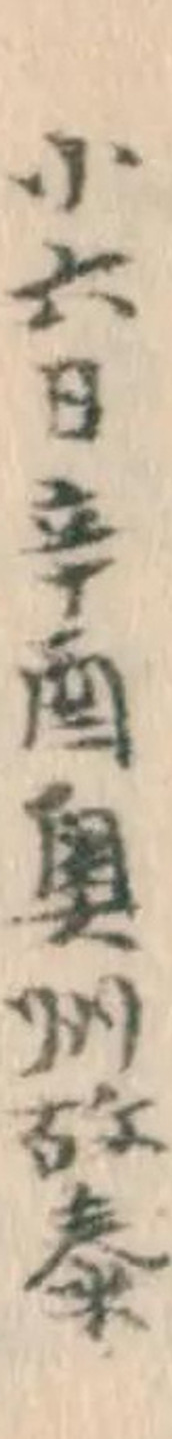小六日辛酉奥州故泰
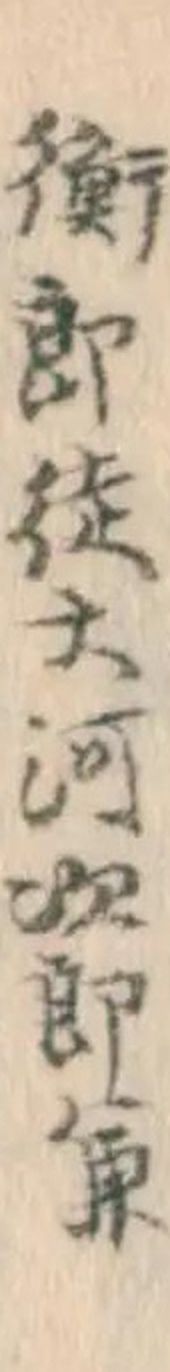衡郎徒大河次郎兼
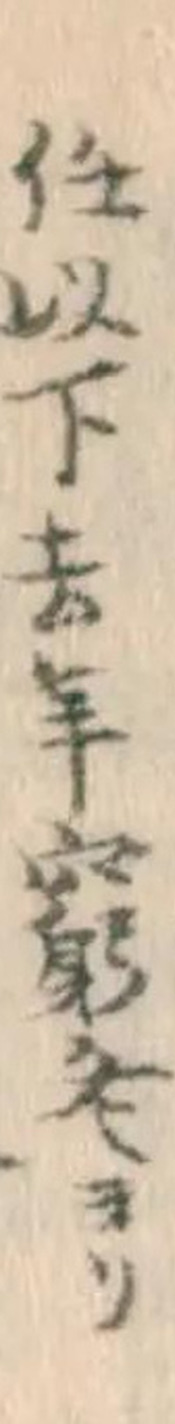任以下去年窮冬ヨリ
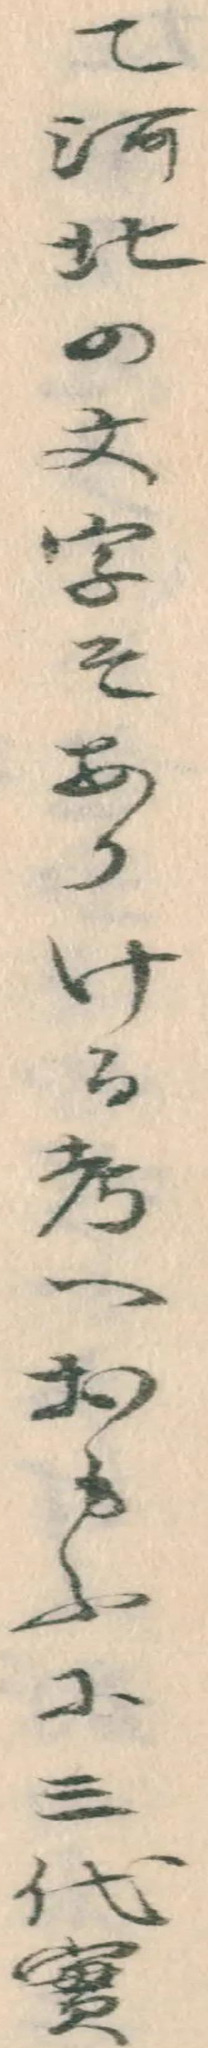て河北の文字そありける考へおもふに三代實
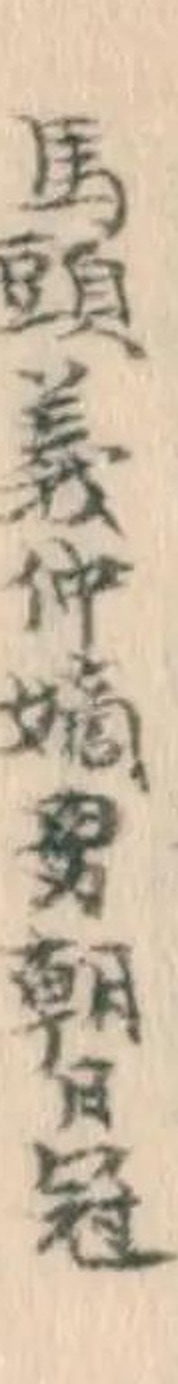馬頭義仲嫡男朝日冠
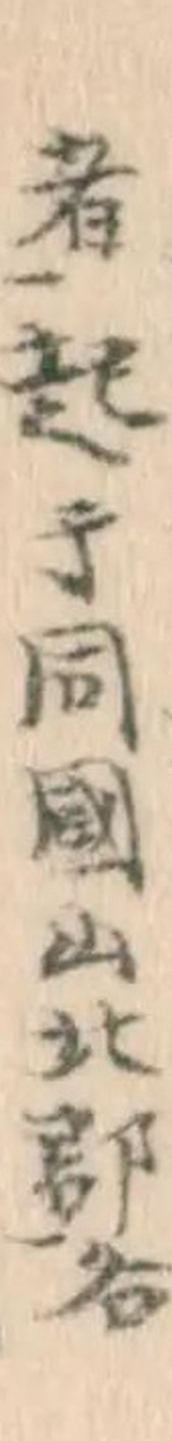者起于同國山北郡各
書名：眞澄遊覽記[第2冊]
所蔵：国立国会図書館 National Diet Library, JAPAN
